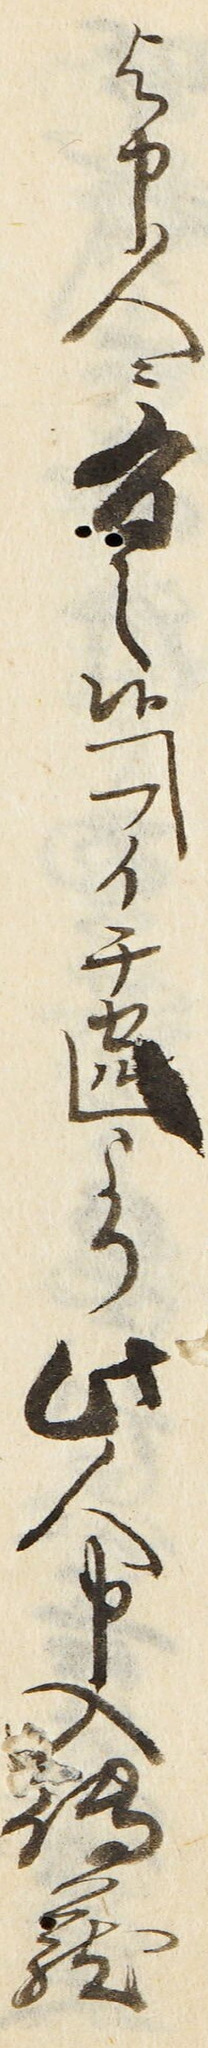と申人ニ有之候「フイチセル」より此人申入傳蔵
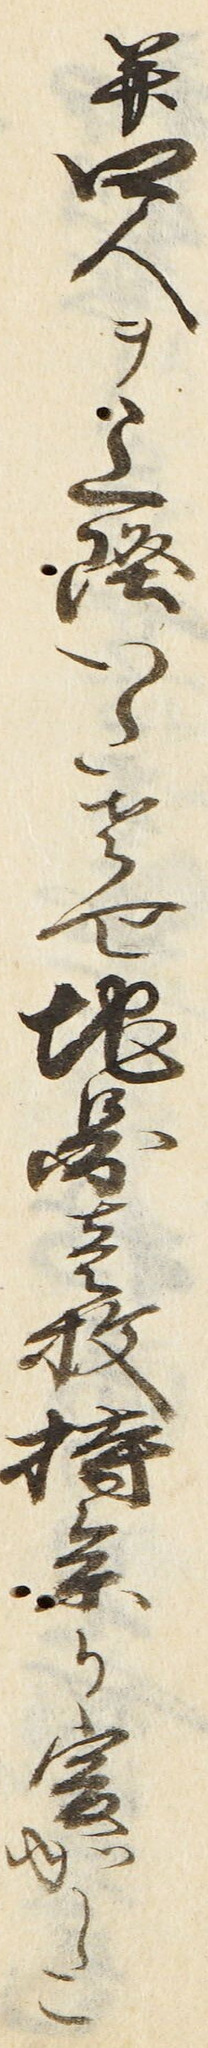幷四人ヲ上陸いたさせ地圖壱枚持参り爰かしこ
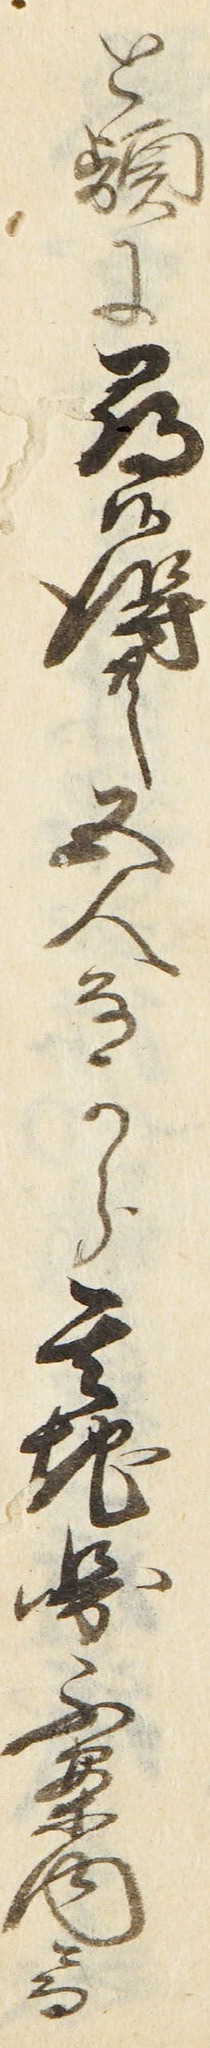と頻に尋候得共五人なから其地圖不案内ニ而
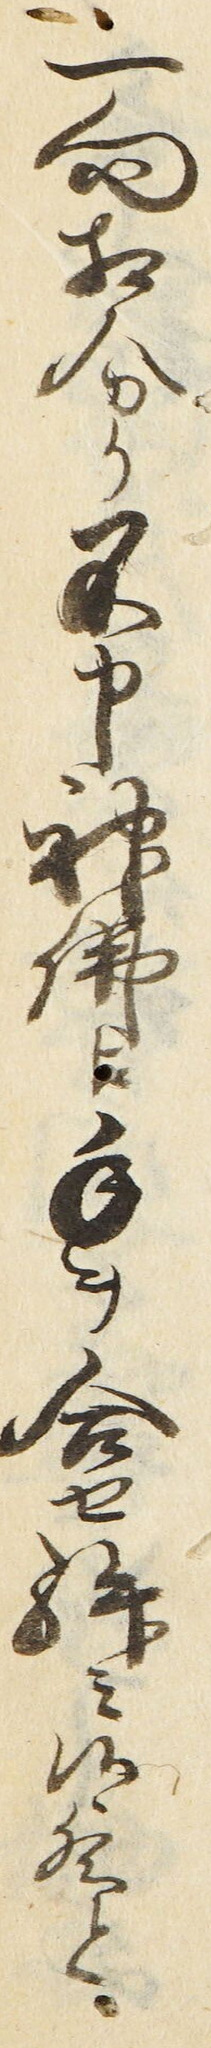一向相分り不申神佛江手ヲ合セ拝ミ候欤と

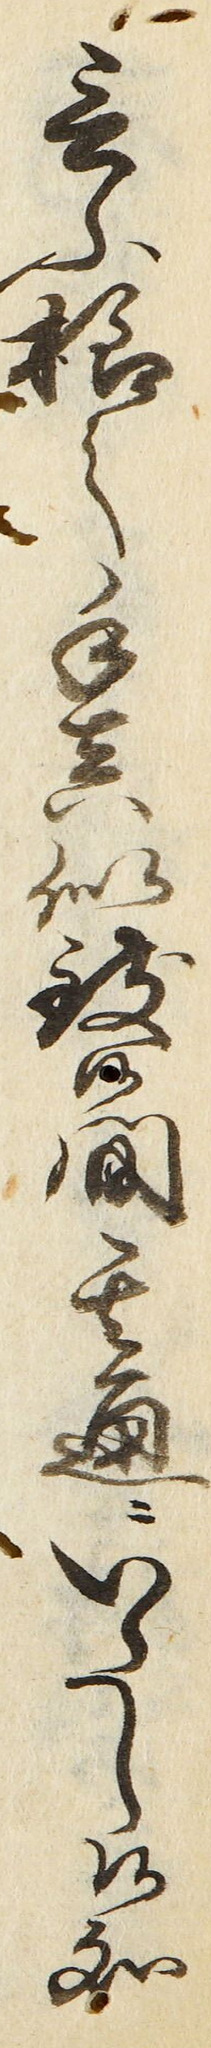言ふ様之手真似致候間其通ニいたし候処
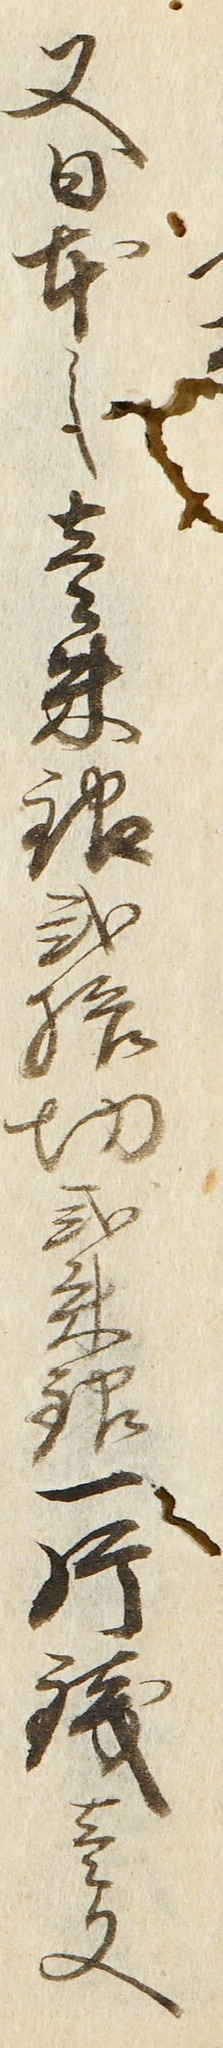又日本之壱朱銀弐拾切弐朱銀一片銭壱文
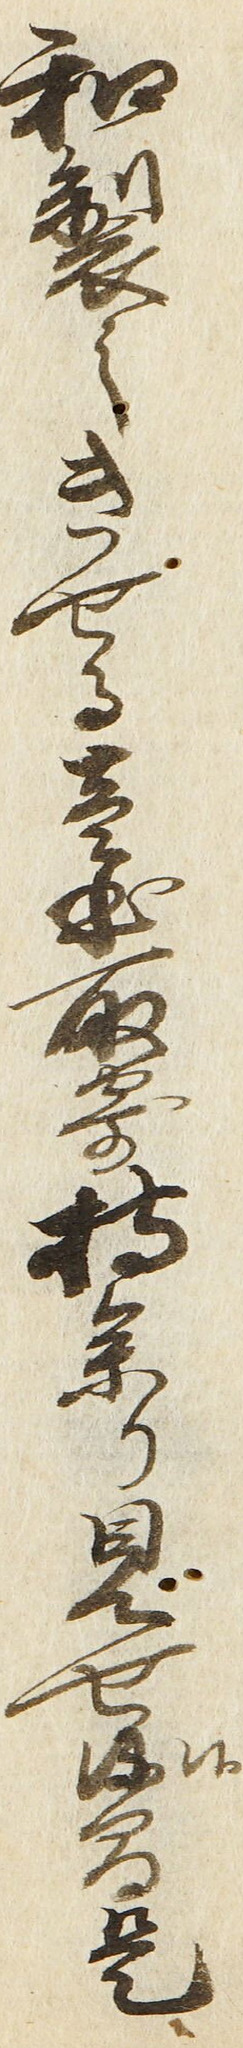和製之きせる壱本取寄持参り見せ候間是
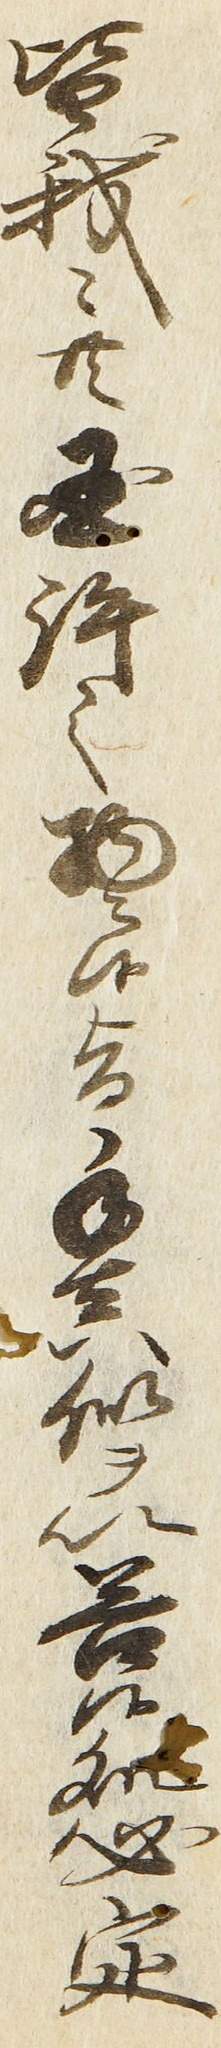皆我々共国許之物ニ候旨手真似ヲ以答候処必定
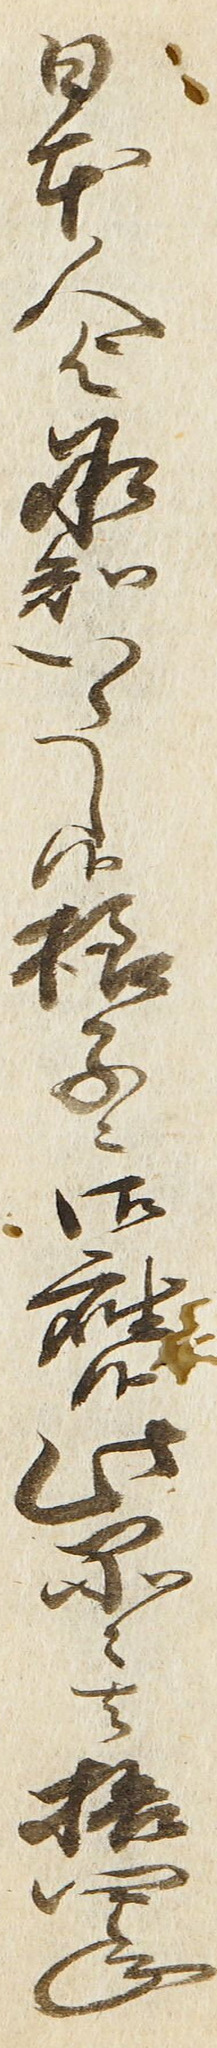日本人と承知いたし候様子ニ御座候此品々者拾四年
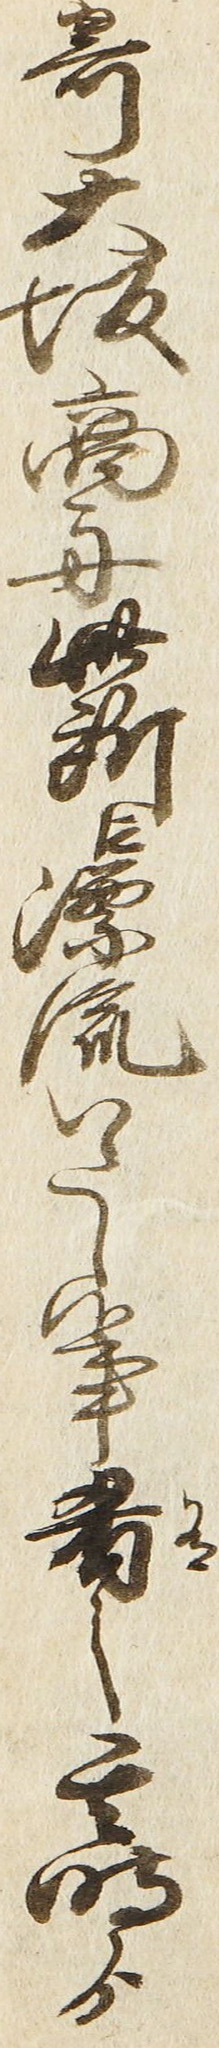寄大坂商舟此所江漂流いたし候事有之其時ゟ
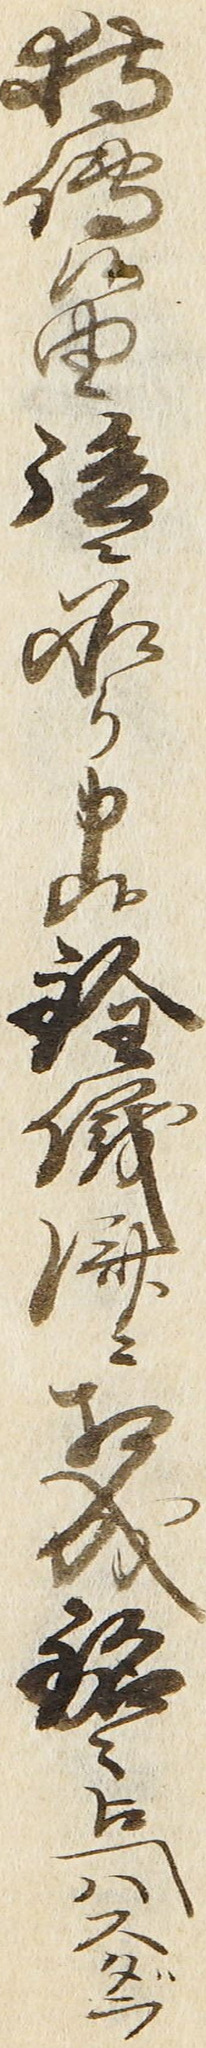持傳候由後ニ承り申候詮儀済ニ相成銘々江「ハスダラ
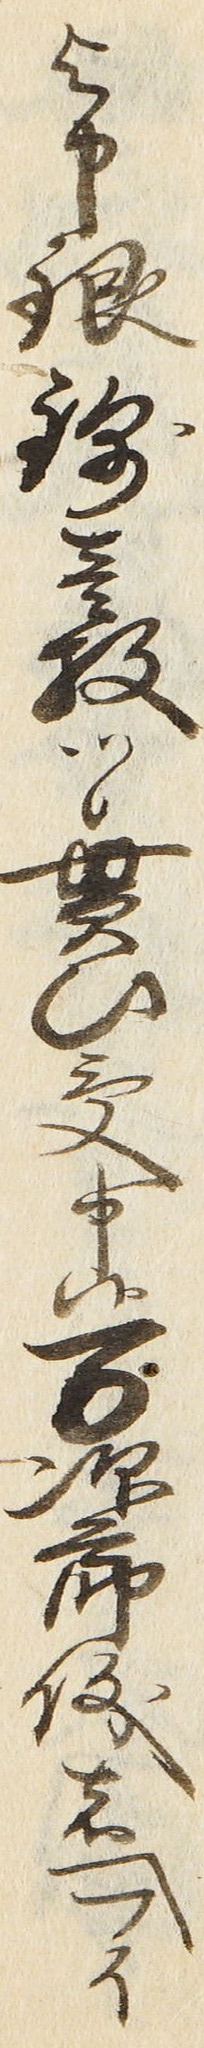と申銀銭壱枚ツヽ貰ひ受申候万次郎儀者「フイ
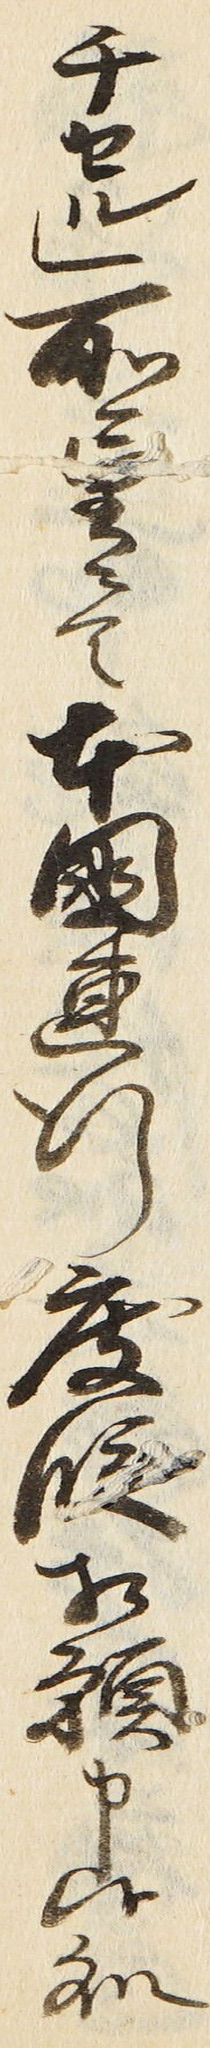チセル」所望ニて本國連行度段相願申候処
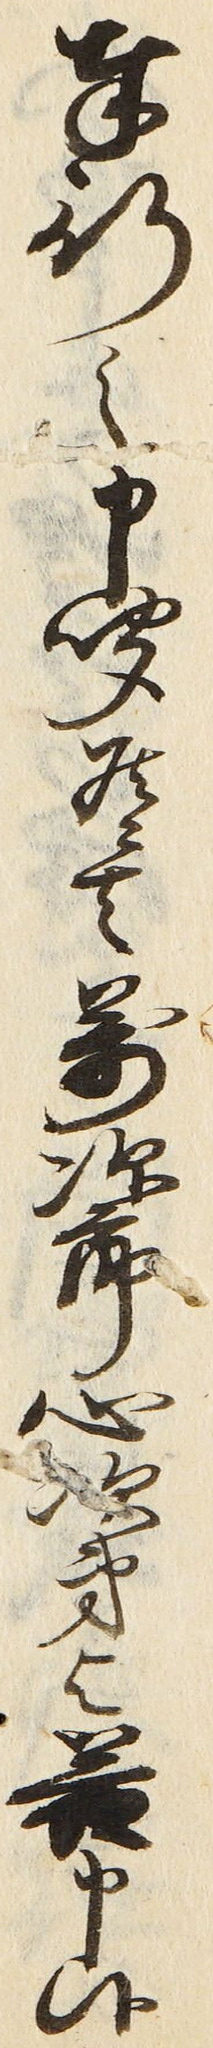奉行之申聞候者萬次郎心次第と答申候
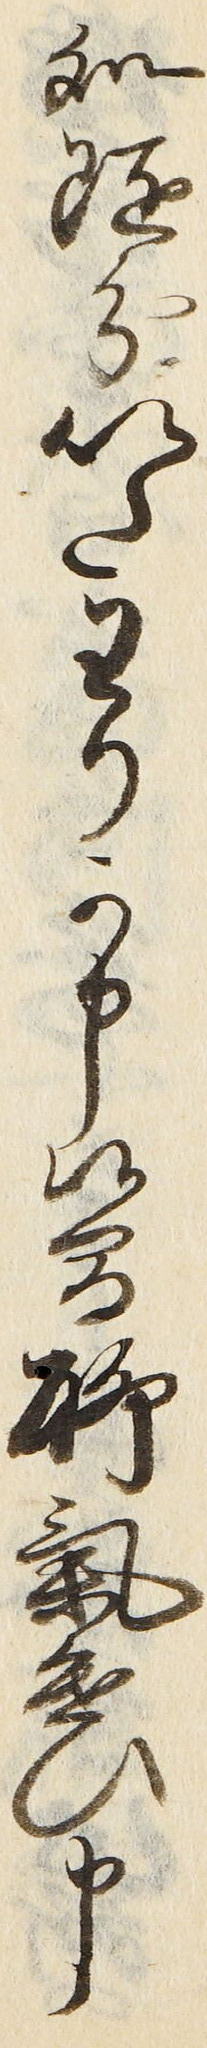処随分いたわり可申候間聊氣遣ひ申
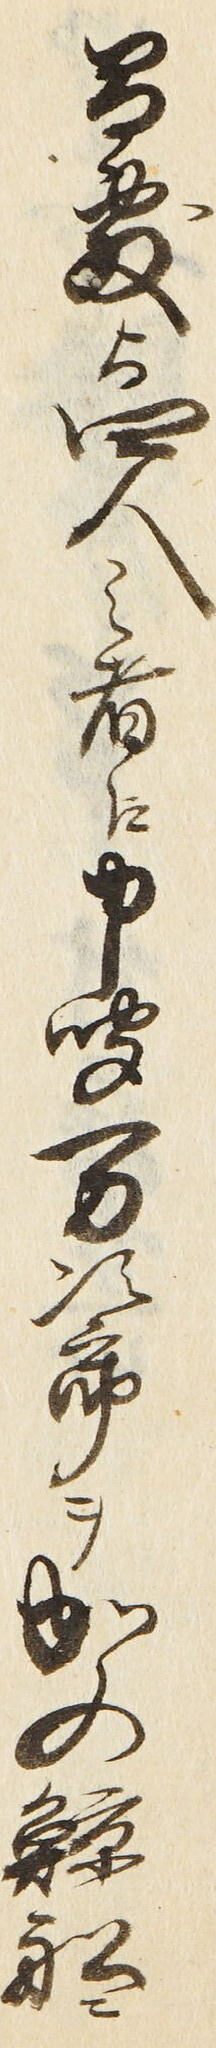間敷と四人之者江申聞万次郎ヲかの鯨舩ニ
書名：漂客談寄
